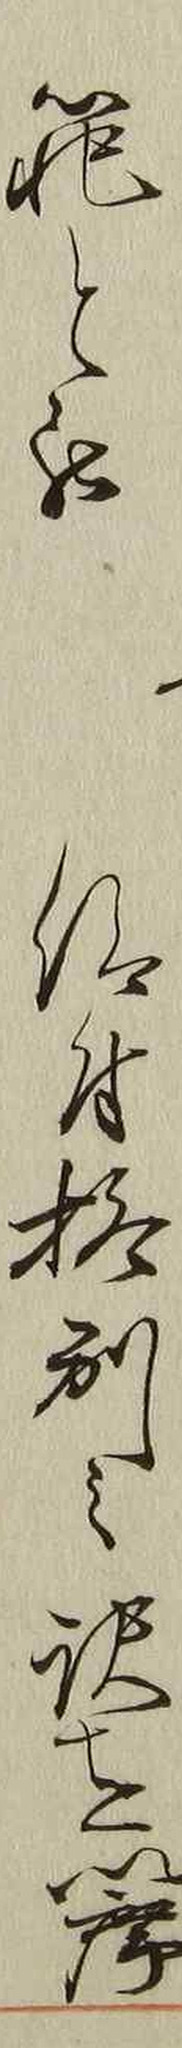範と被仰付格別之訳を以席
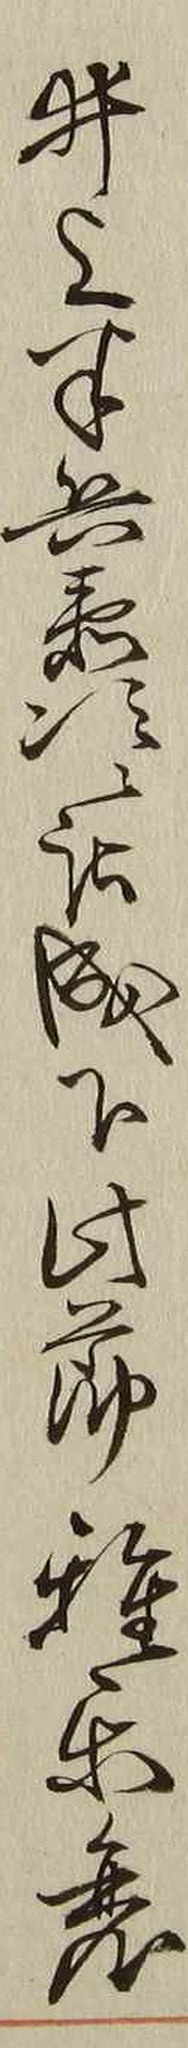井上半兵衛次ニ被成下此節雅楽衰
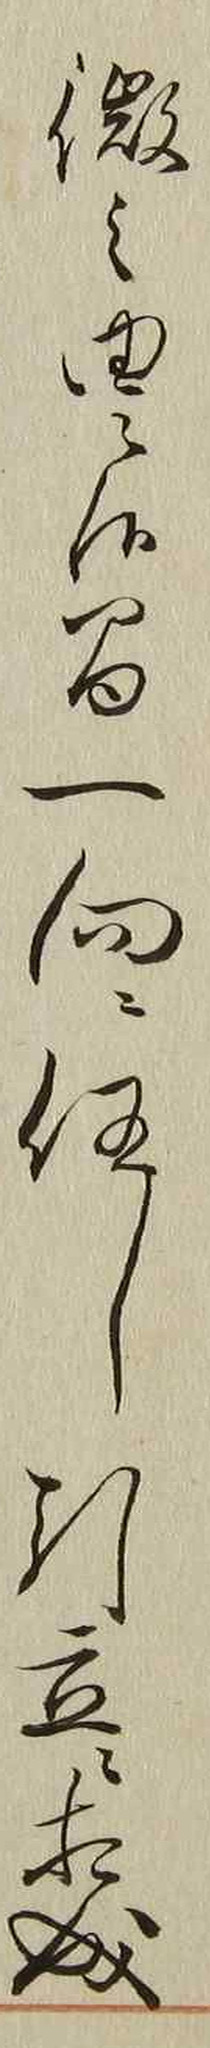微之由ニ候間一向ニ任し引立ニ相成
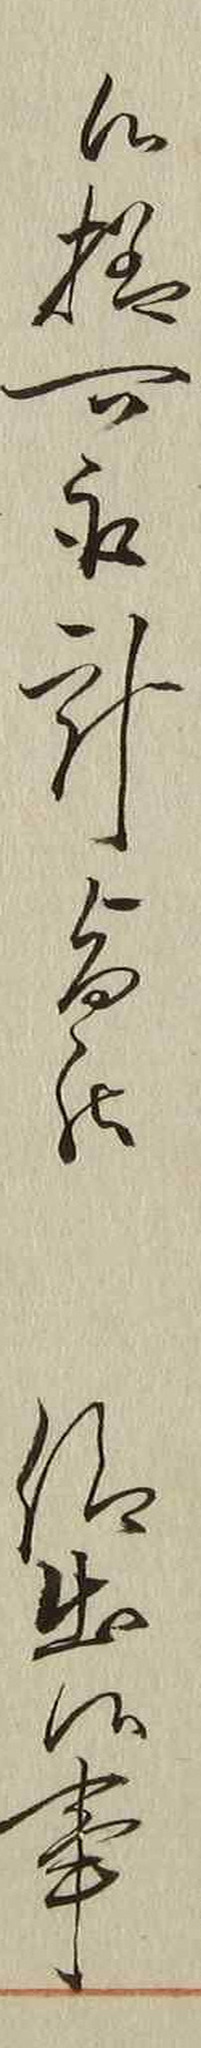候様可取計旨被仰出候事
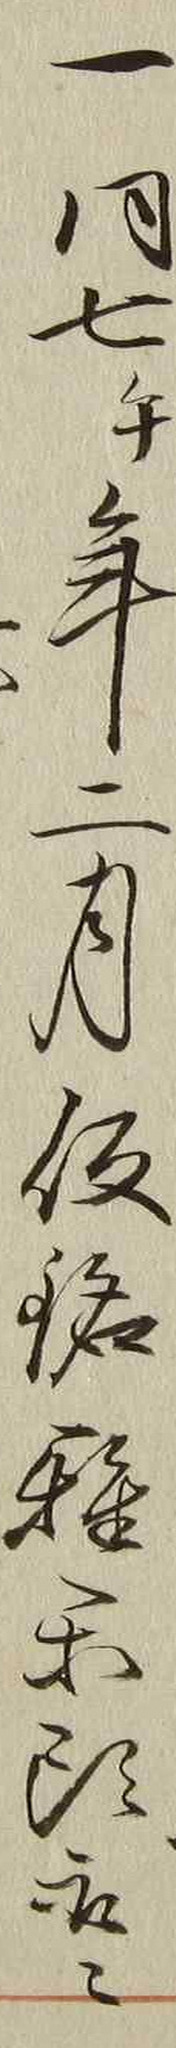一同七午年二月仮銘雅楽頭取ニ
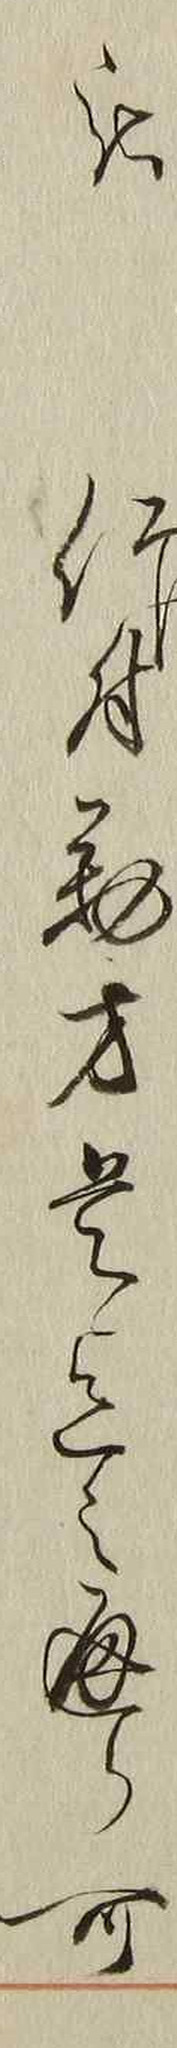被仰付勤方是迄之通り可
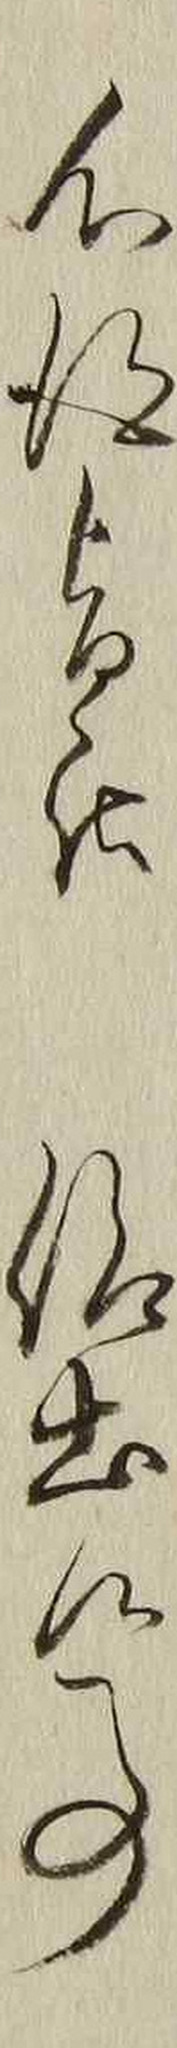心得旨被仰出候事
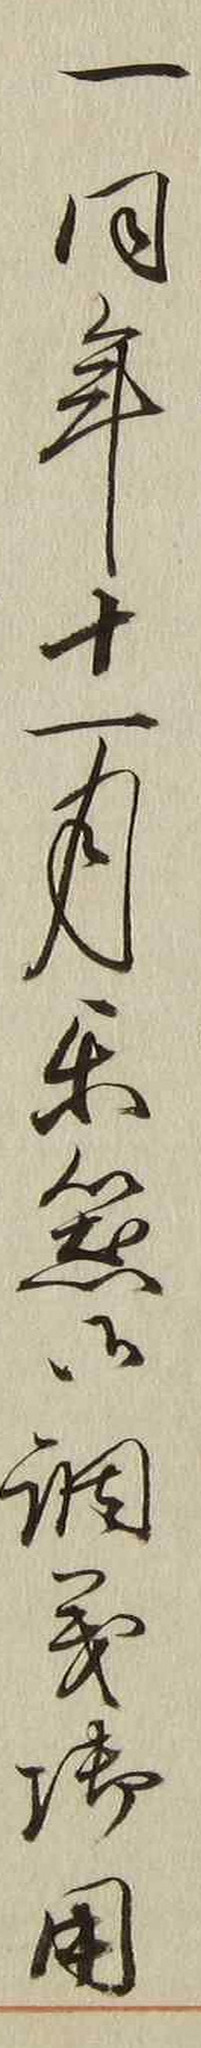一同年十一月楽器御調義御用
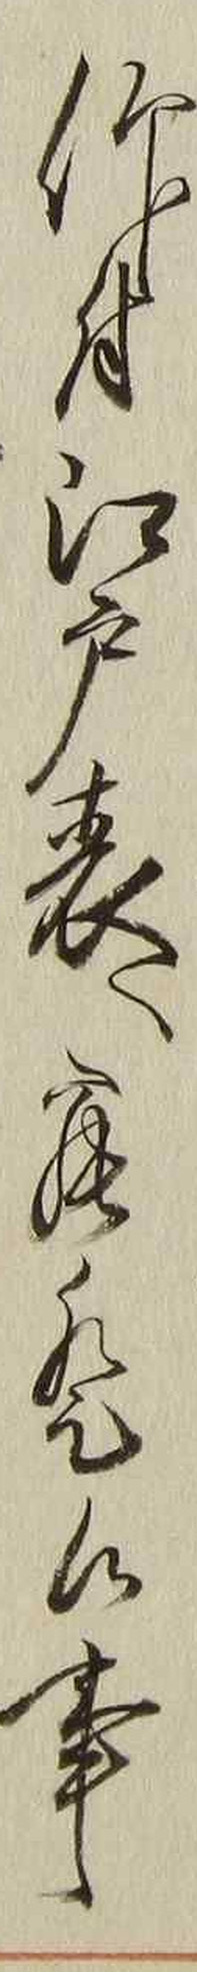被仰付江戸表へ罷登候事
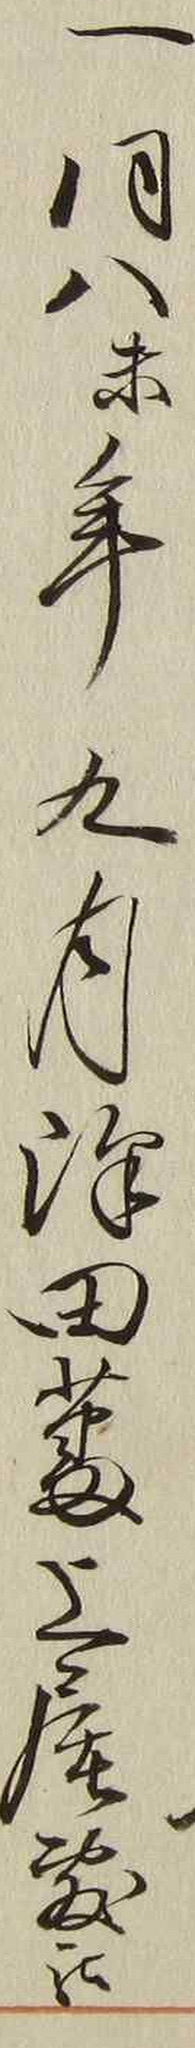一同八未年九月沢田蕃上屋敷被
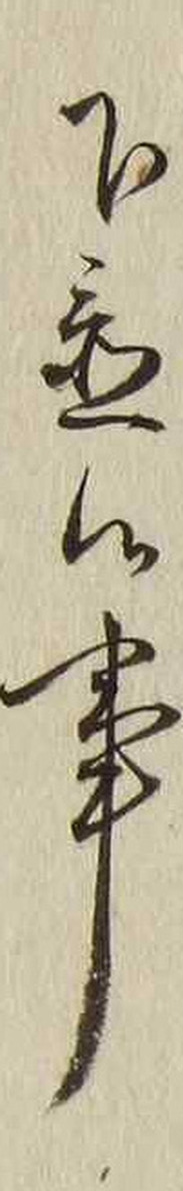下置候事
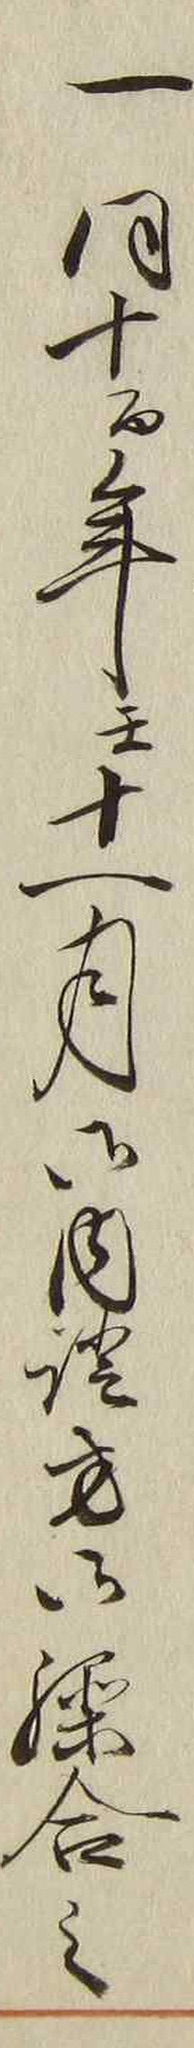一同十酉年閏十一月御内證方御繰合之

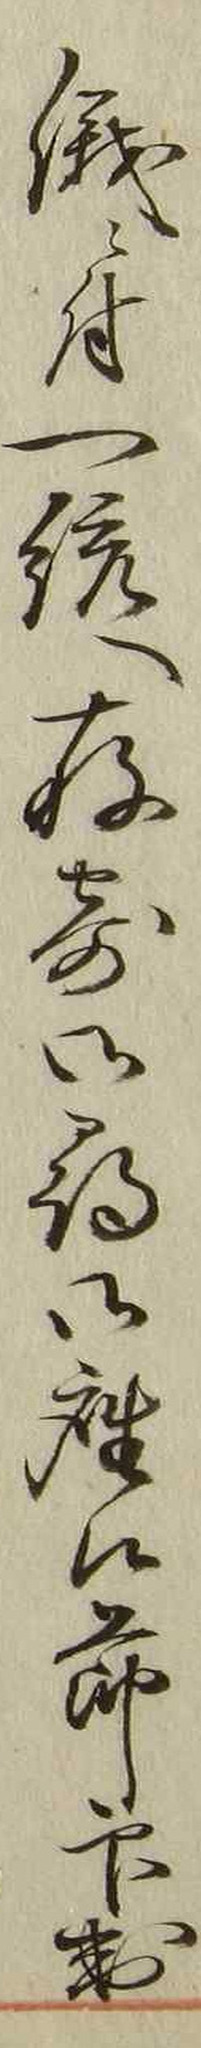儀ニ付一統へ存寄御尋御座候節印封
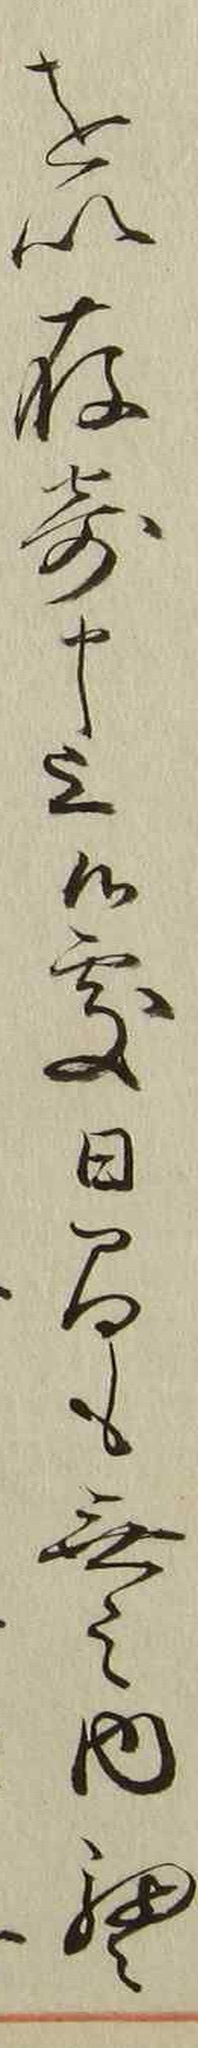を以存寄申上候処日間も無之内細々
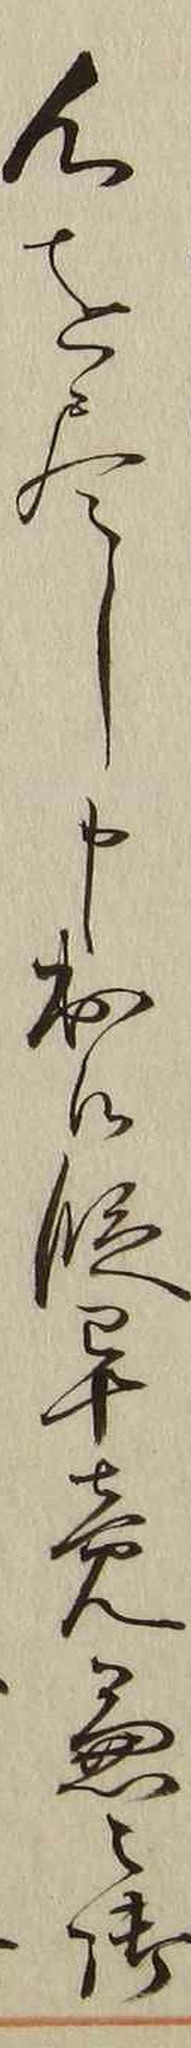心を尽し申出候段畢境竟兼々御
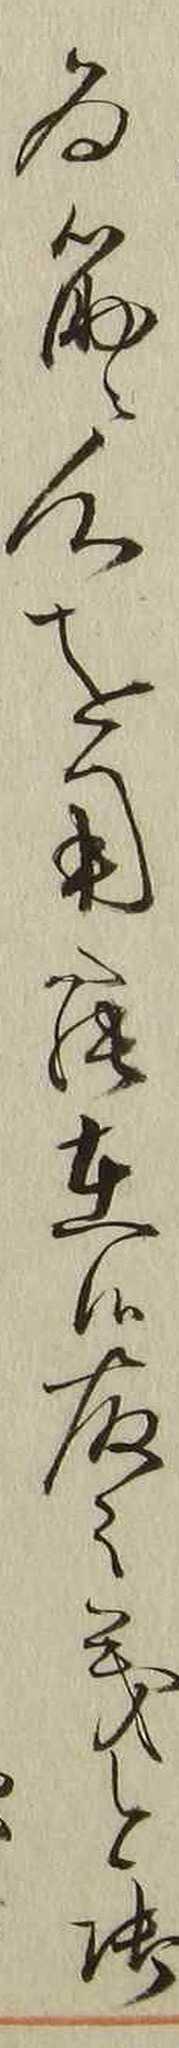為筋ニ心を用罷在候故之義と御
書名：諸士系譜　巻之57　ほ之部4
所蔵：会津若松市立会津図書館
